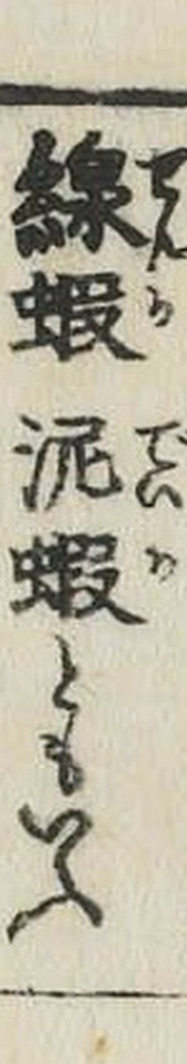線蝦泥蝦ともいふ
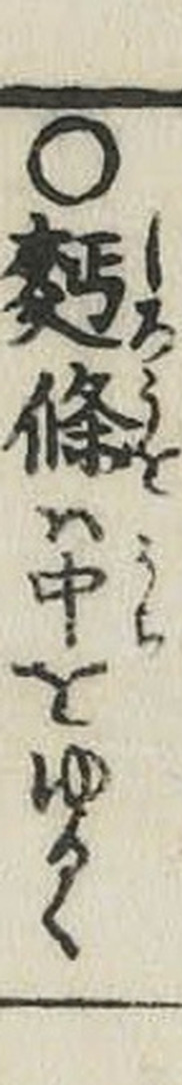○麪條は中をゆるく
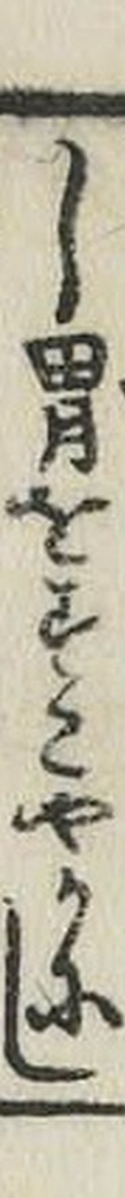し胃をすこやかにし
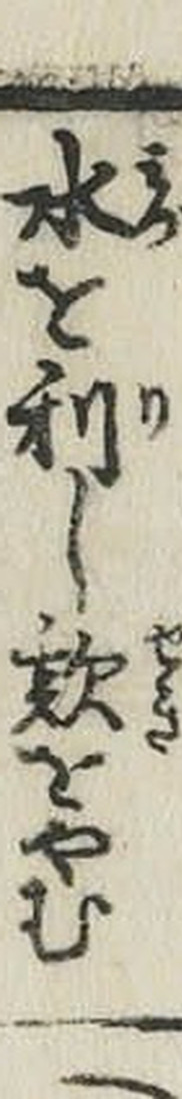水を利し欬をやむ
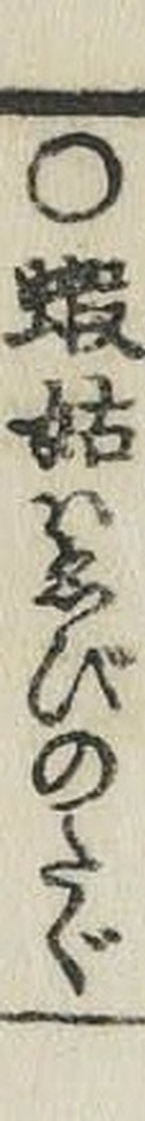○蝦姑はゑびのたぐ

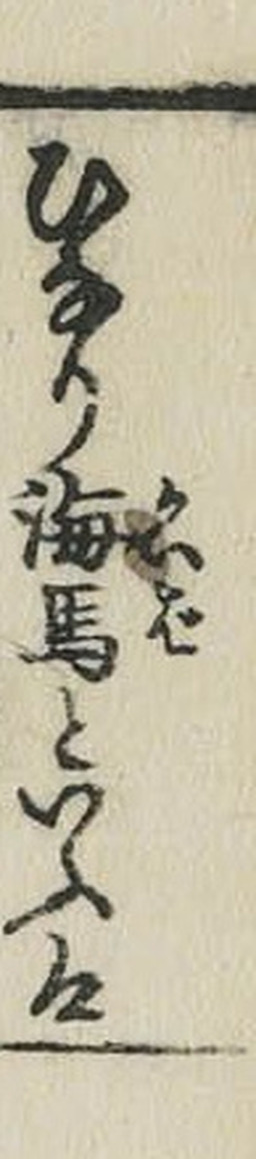ひなり海馬といふは
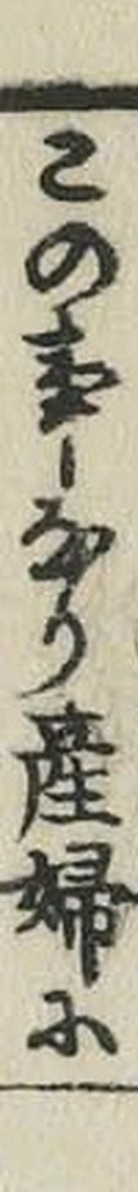この事なり産婦に
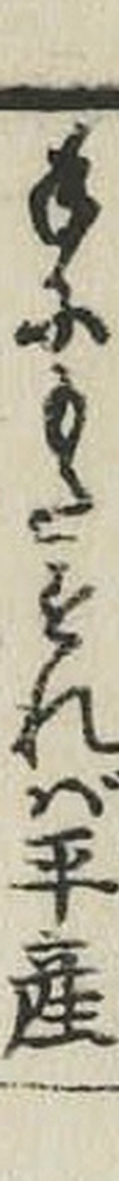手にもたすれば平産
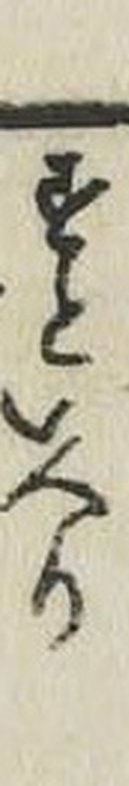すといへり
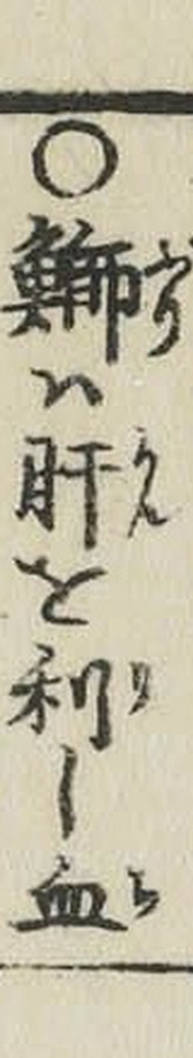○鰤は肝を利し血
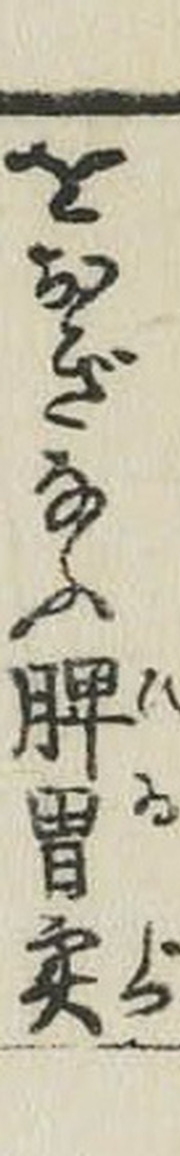をおぎなふ脾胃実
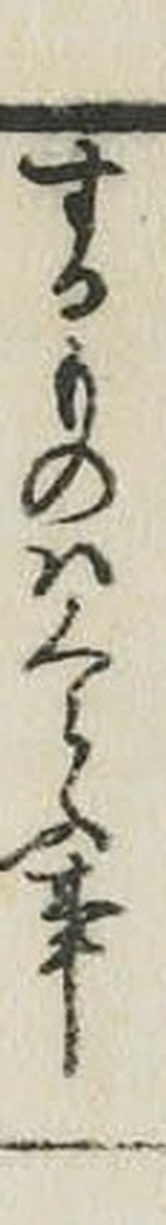するものはくらふ事
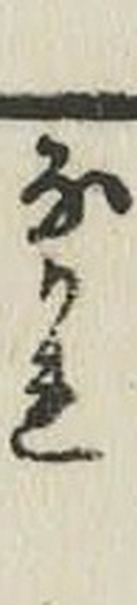なかれ
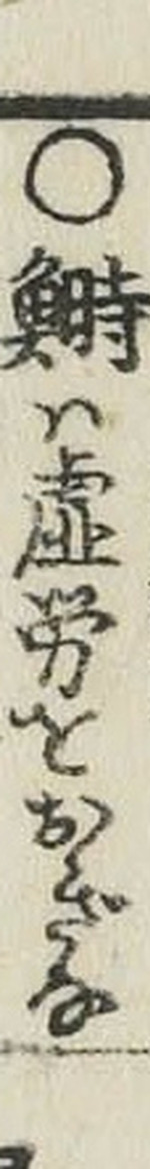○鰣は虚労をおぎな
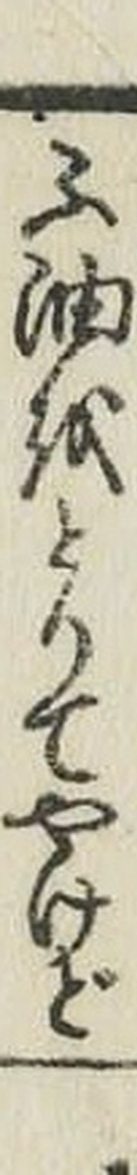ふ油をとりてやけど
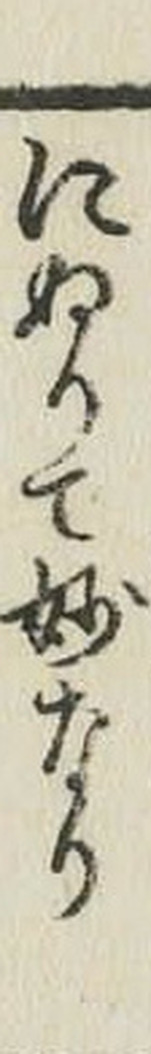にぬりて妙なり
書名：増補頭書訓蒙図彙大成 10巻 7:巻之14-16
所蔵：東京学芸大学教育コンテンツアーカイブ
